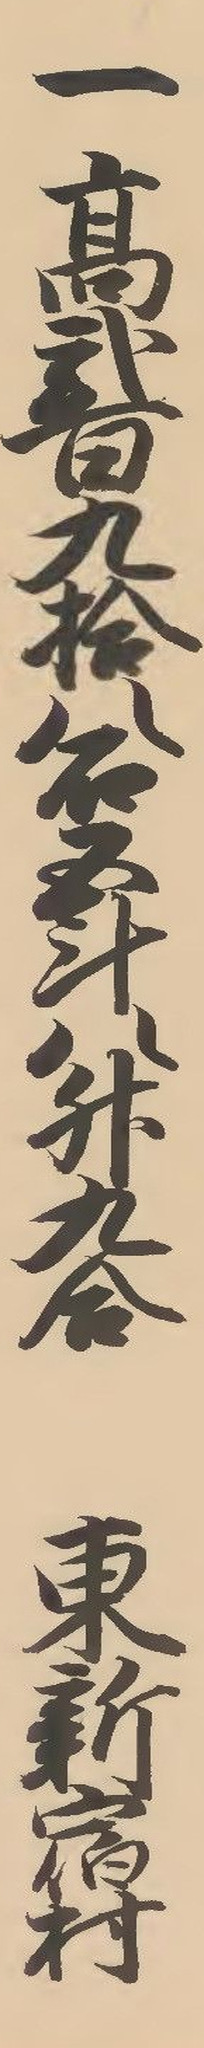一髙弐百九拾八石五斗八升九合東新宿村
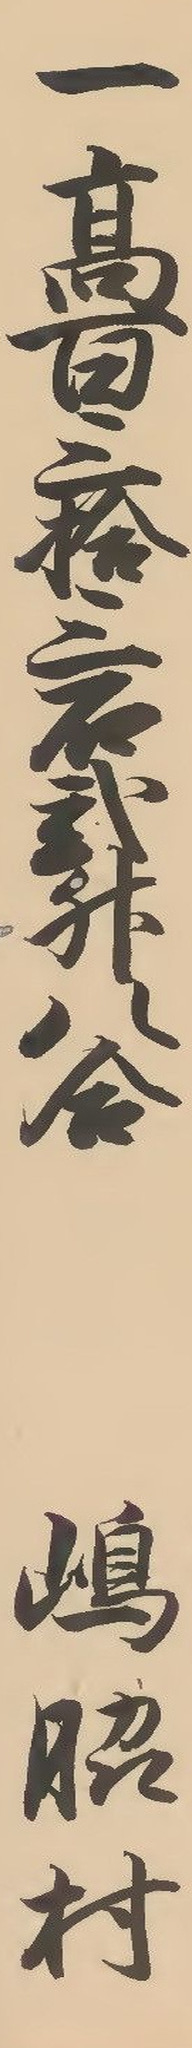一髙百三拾三石弐升八合嶋脇村
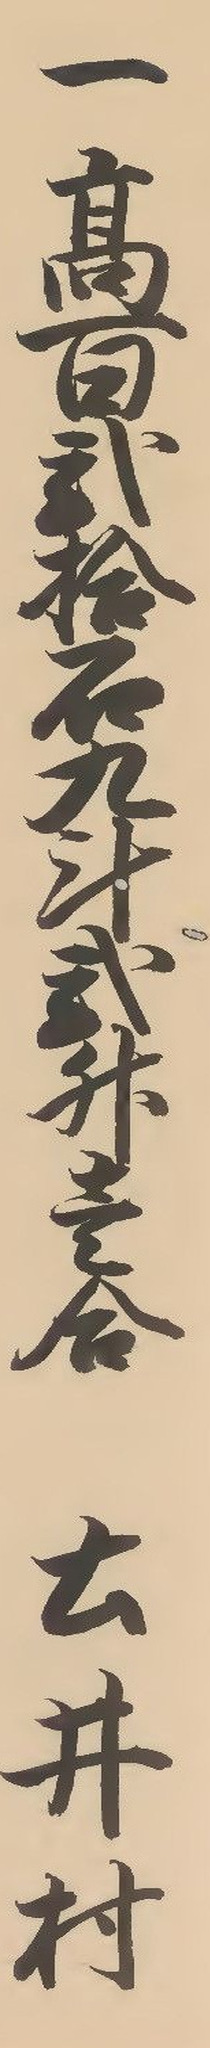一髙百弐拾石九斗弐升壱合土井村
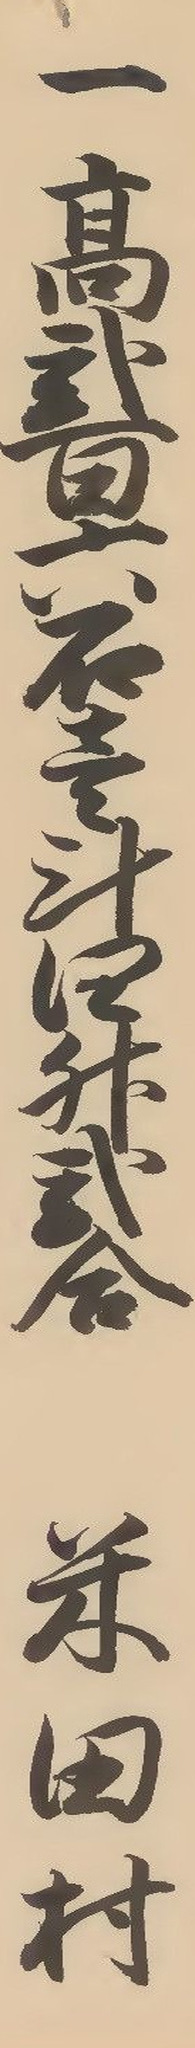一髙弐百六石壱斗四升弐合米田村
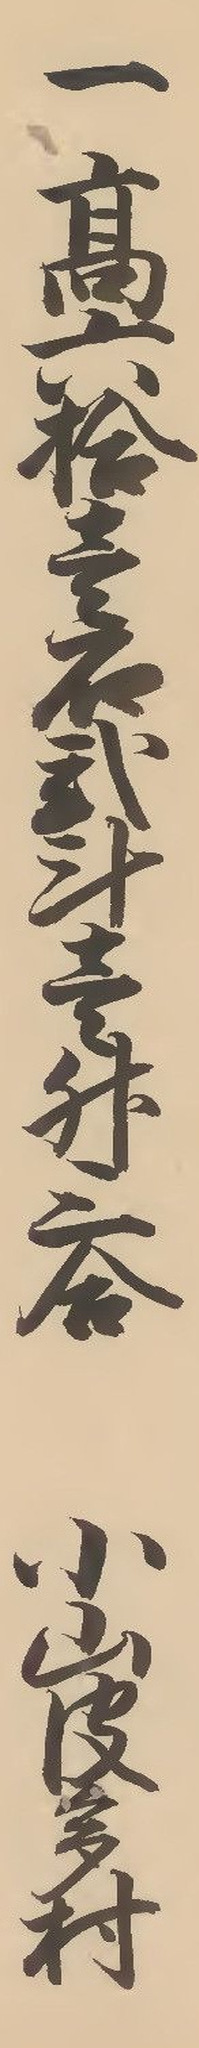一髙六拾壱石弐斗壱升三合小山皮多村
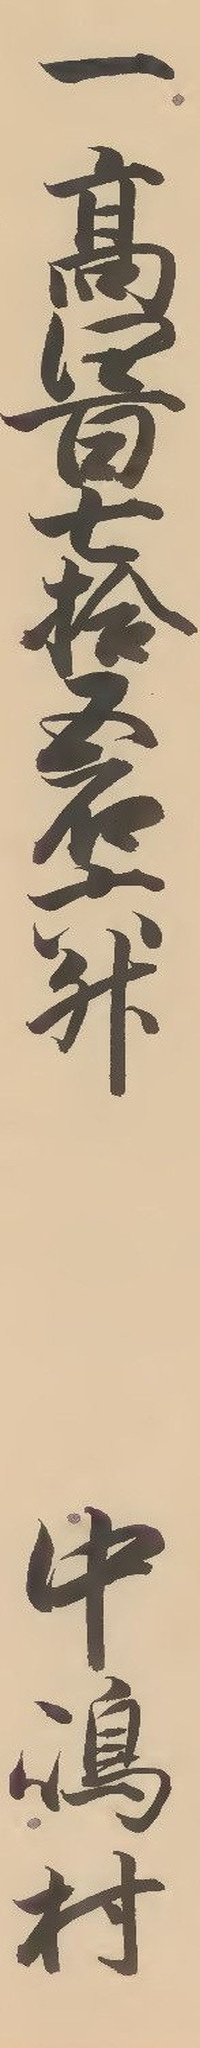一髙四百七拾五石六升中嶋村

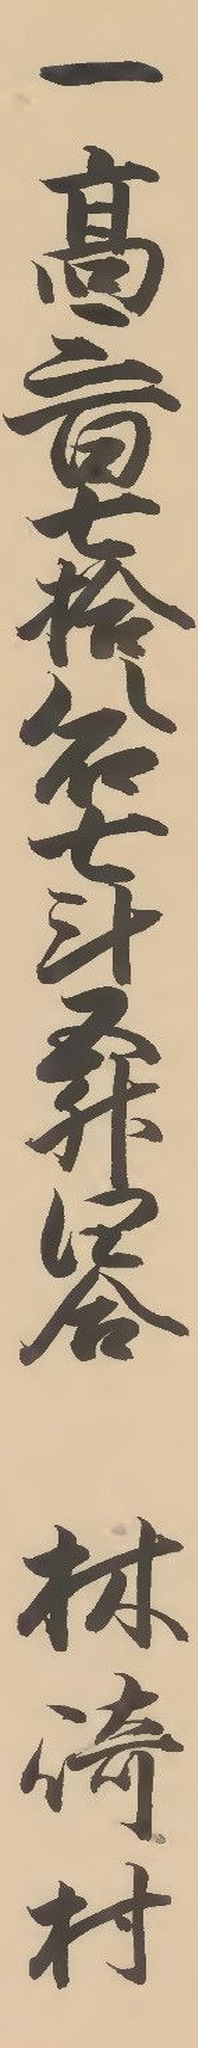一髙三百七拾八石七斗五升四合林崎村
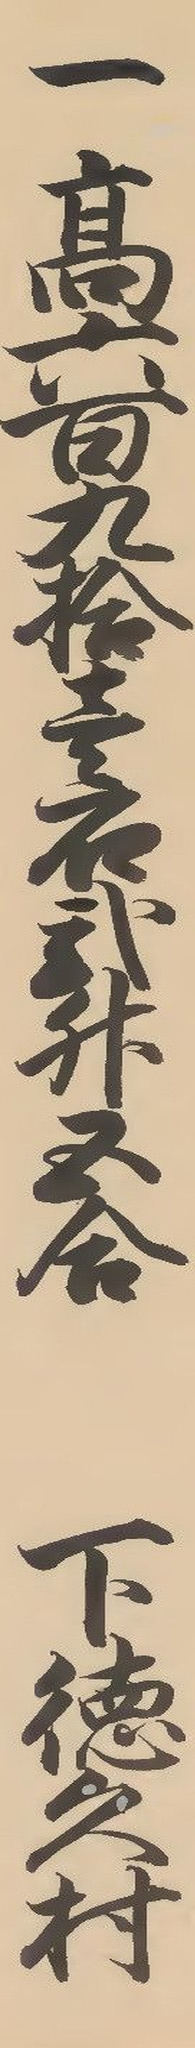一髙六百九拾壱石弐升五合下徳久村
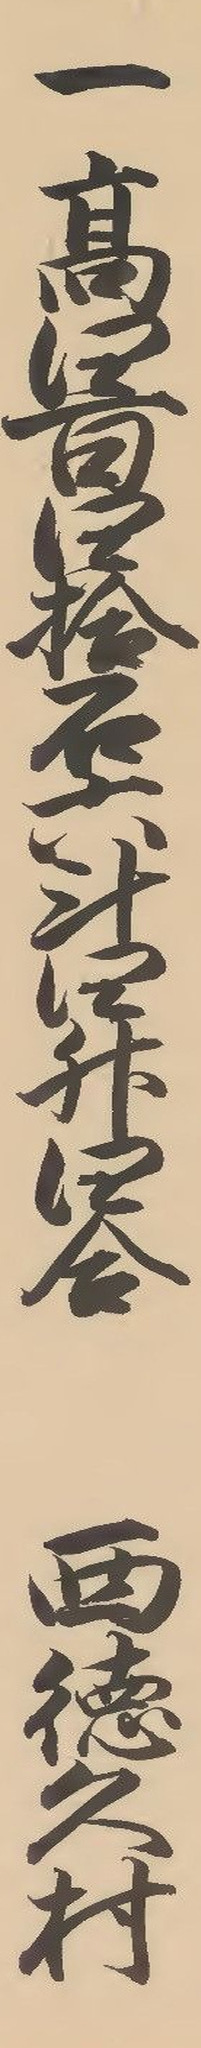一髙四百四拾石六斗四升四合西徳久村
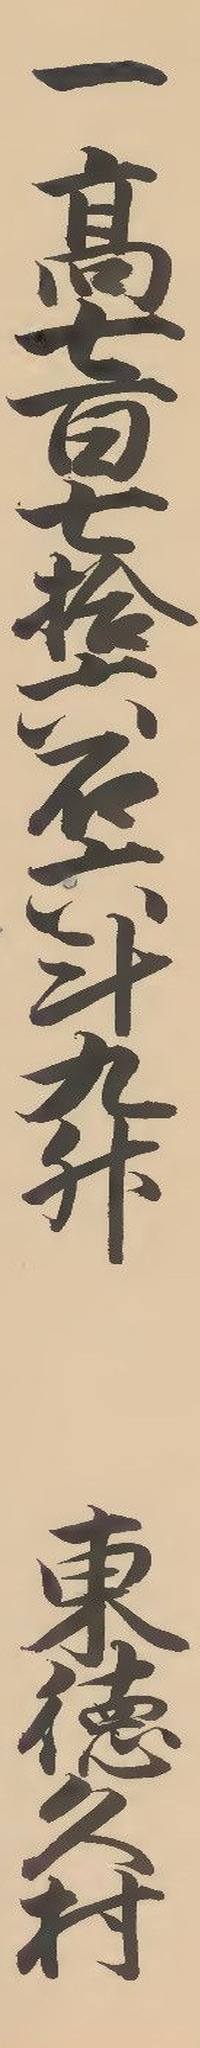一髙七百七拾六石六斗九升東徳久村
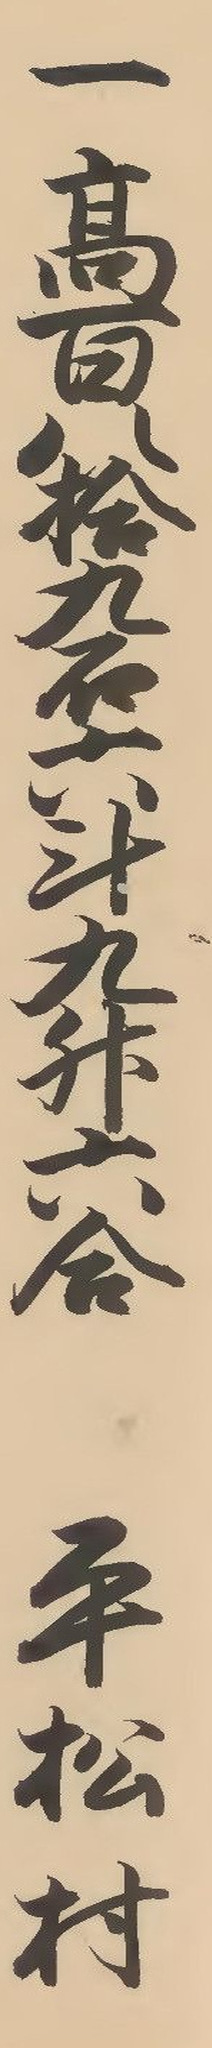一髙百八拾九石六斗九升六合平松村
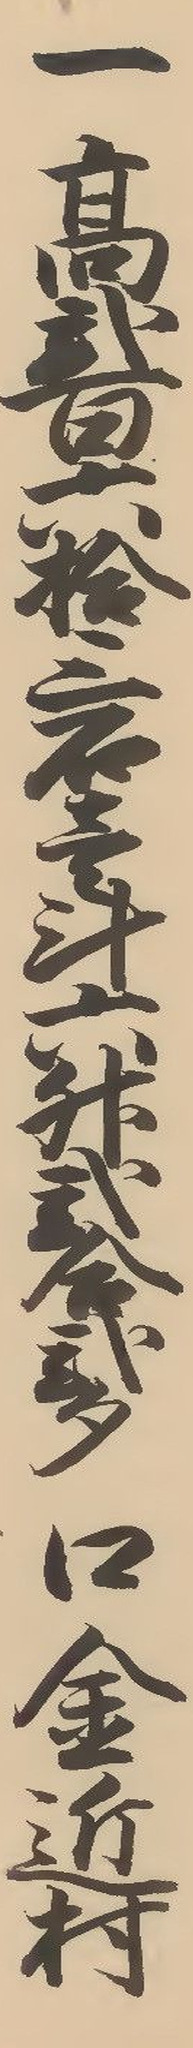一髙弐百六拾三石壱斗六升弐合弐夕口金近村
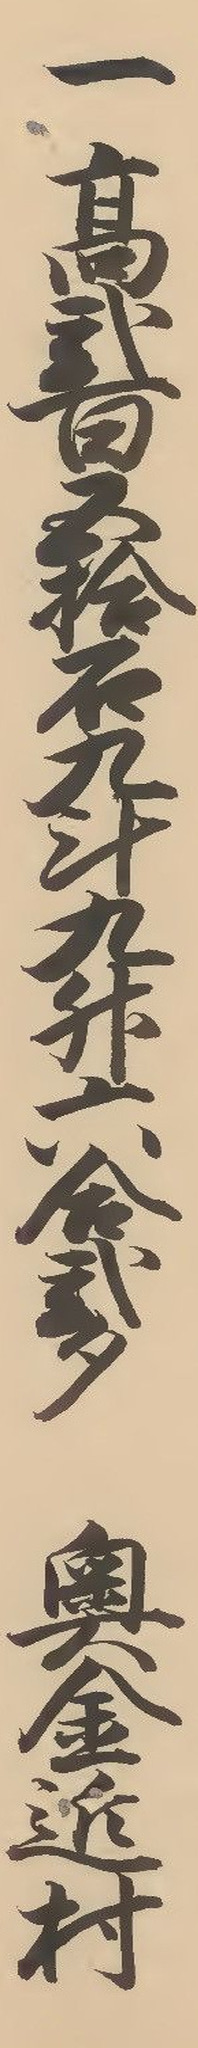一髙弐百五拾石九斗九升六合弐夕奥金近村
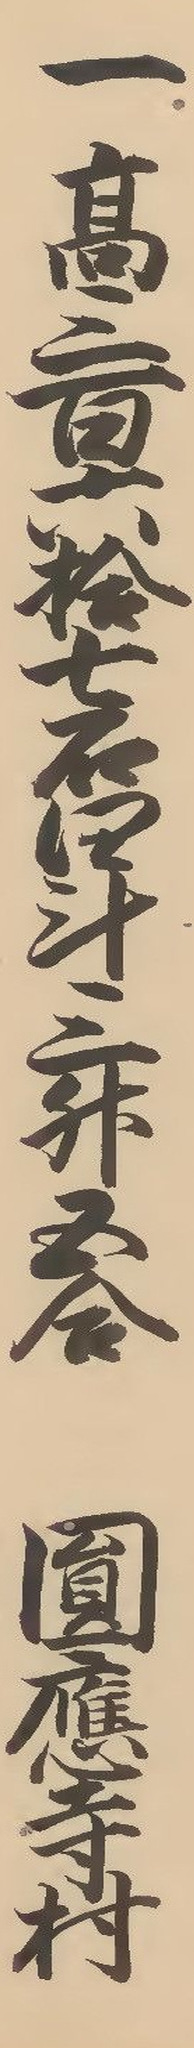一髙三百六拾七石四斗三升五合圓應寺村

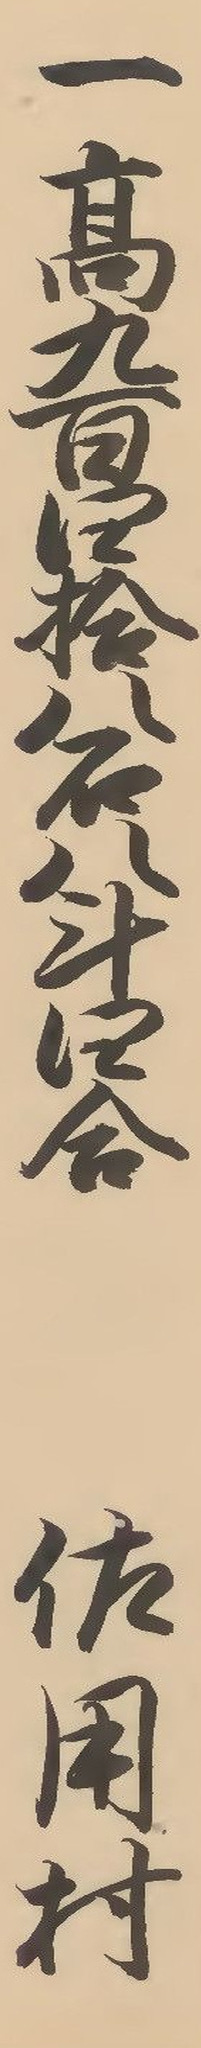一髙九百四拾八石八斗四合作用村
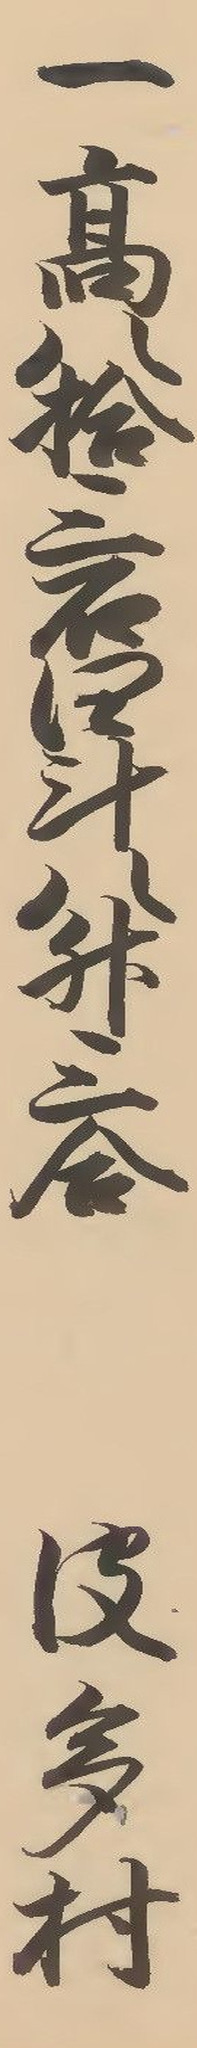一髙八拾三石四斗八升三合皮多村
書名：播磨国郷帳
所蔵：国立公文書館 National Archives of Japan
